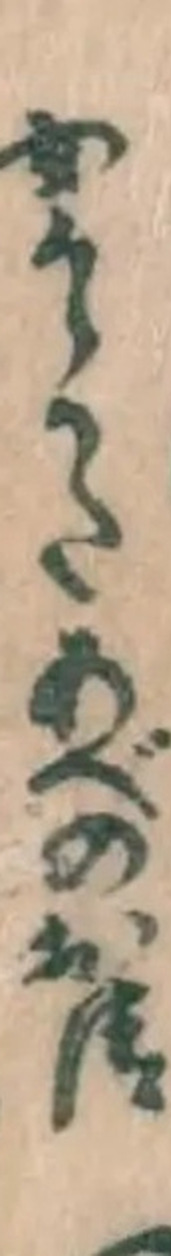女かたかたあべのお清
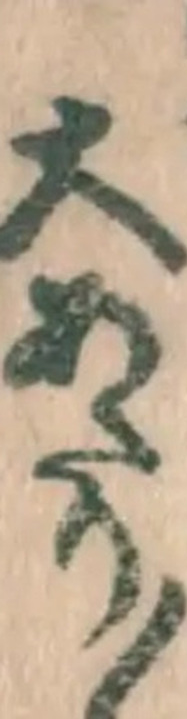大あたり〳〵
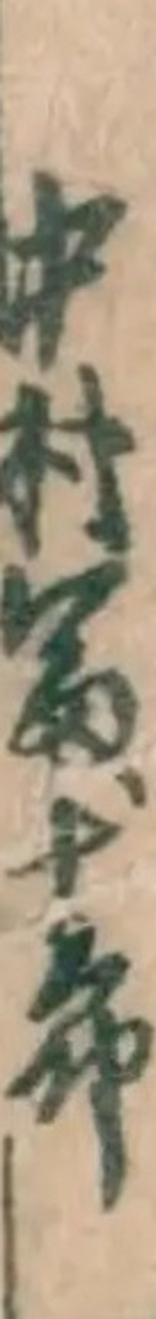中村富十郎
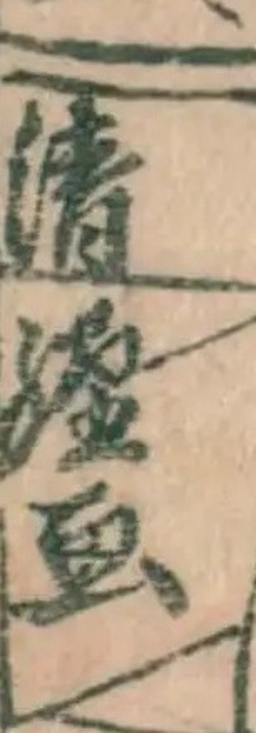清経画
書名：菊慈童酒宴岩窟
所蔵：国立国会図書館 National Diet Library, JAPAN
